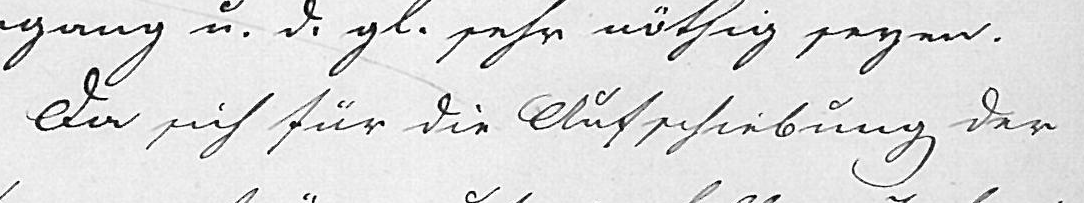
Da sich für der Aufschiebung der
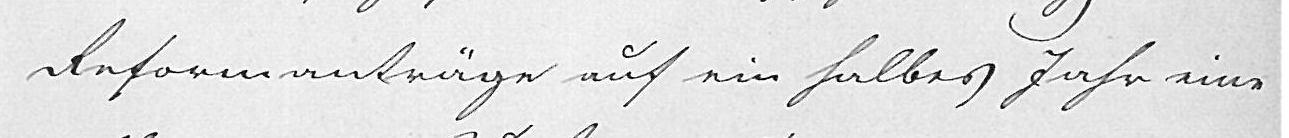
Reformanträge auf ein halbes Jahr eine
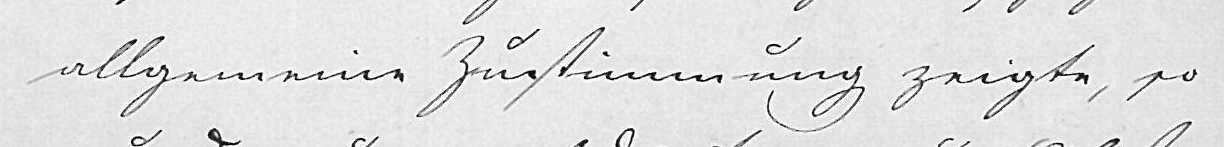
allgemeine Zustimmung zeigte, so
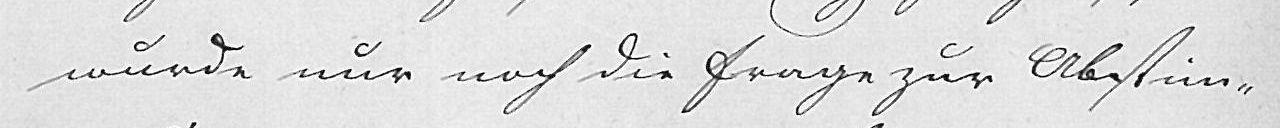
würde nur noch die Frage zur Abstim-
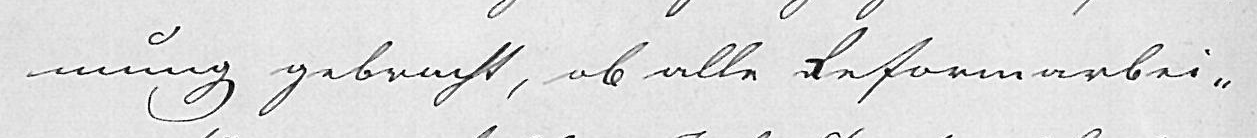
mung gebracht, ob alle Reformarbei-
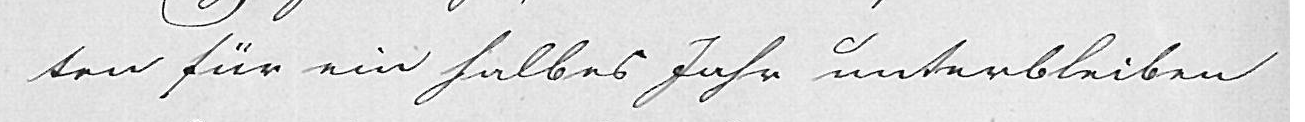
ten für ein halbe Jahr unterbleiben
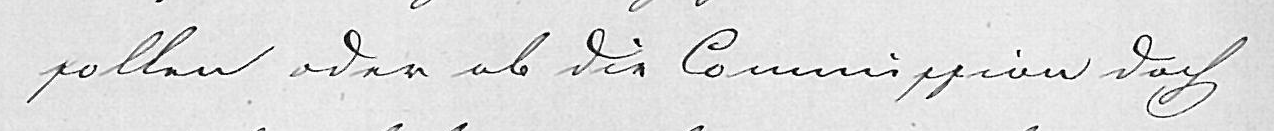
sollen oder ob die Commission doch
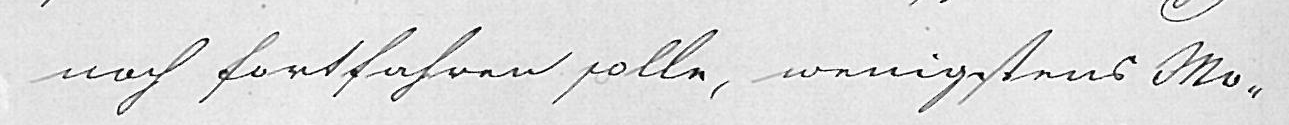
noch fortfahren solle, wenigstens Mo-
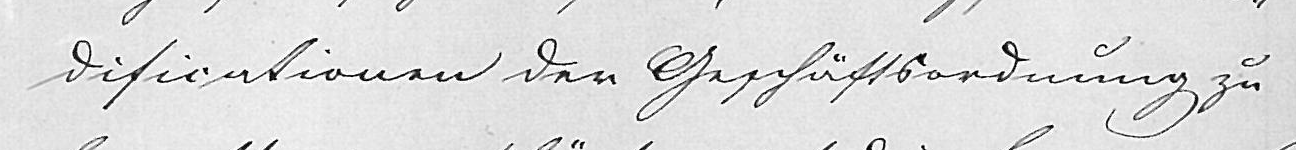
dificationen der Geschäftsordnung zu
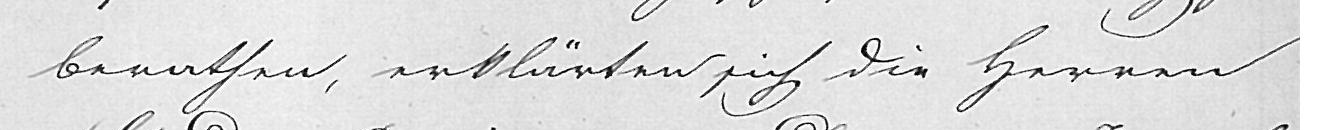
berathen, erklärten sich die Herren
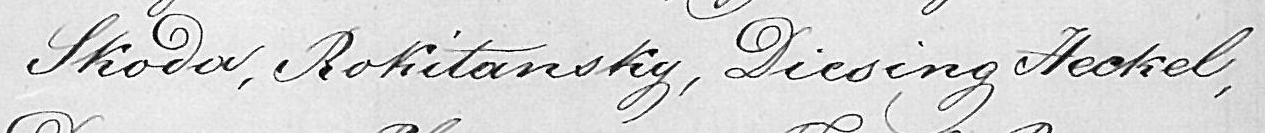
Skoda, Rokitansky, Diesing, Heckel,
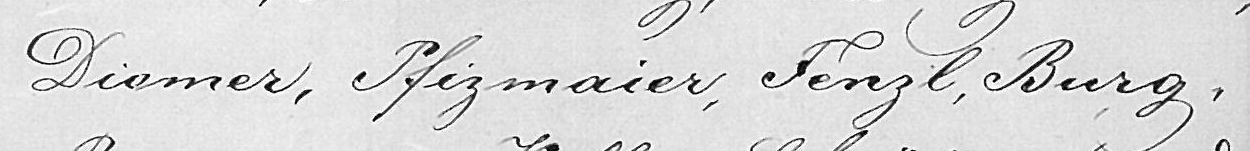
Diemer, Pfizmaier, Fenzl, Burg,
